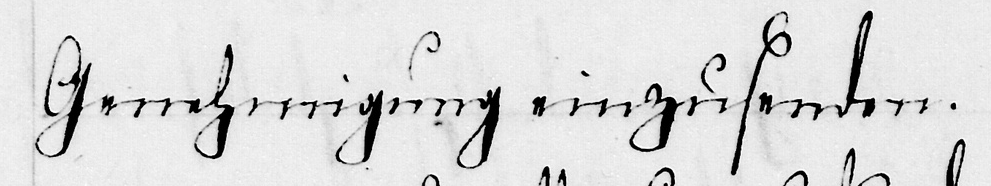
Genehmigung einzusenden.
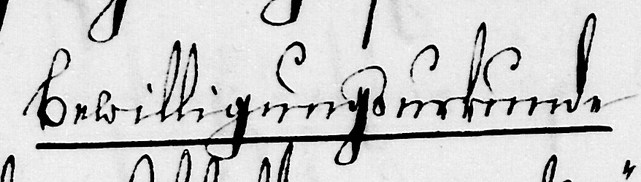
Bewilligungsurkunde
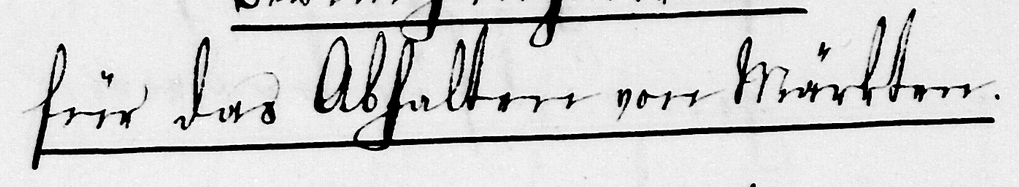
für das Abhalten von Märkten.
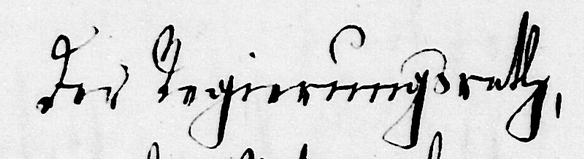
Der Regierungsrath,
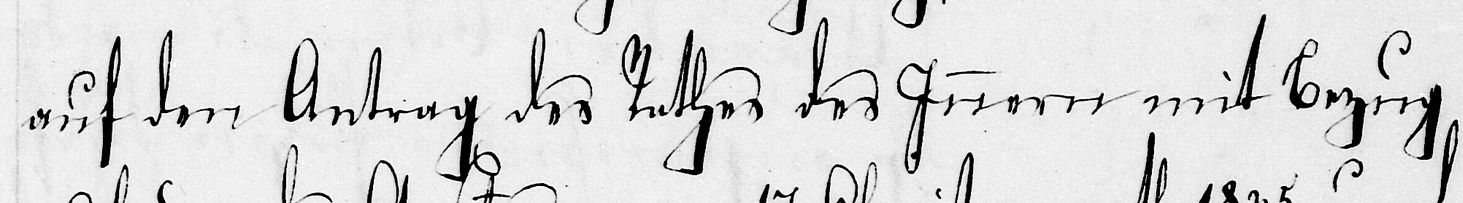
auf den Antrag des Rathes des Innern mit Bezug
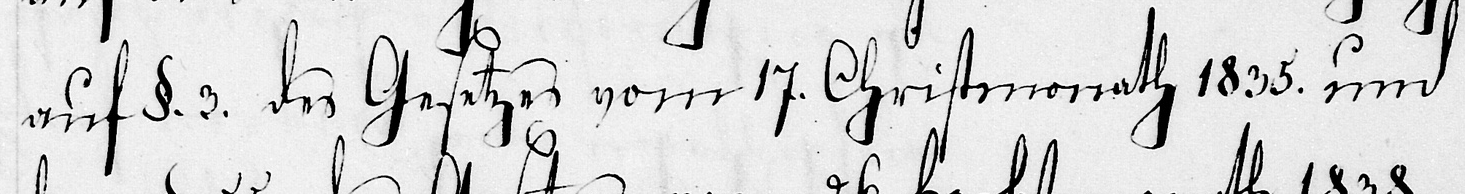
auf §. 3. des Gesetzes vom 17. Christmonath 1835. und
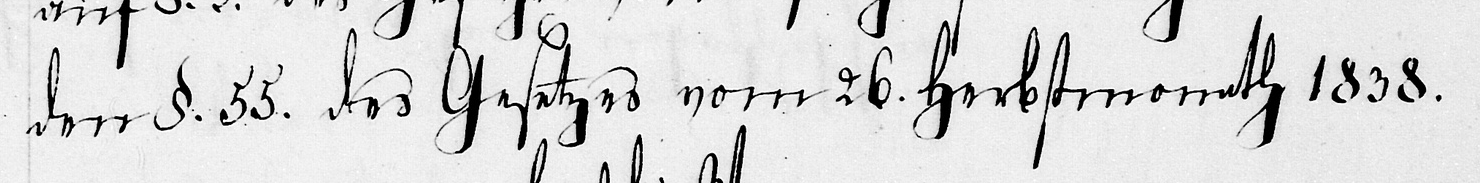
den §. 55. des Gesetzes vom 26. Herbstmonath 1838.
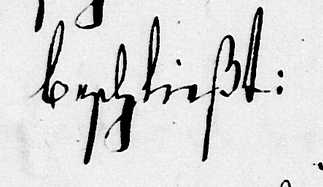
beschließt:
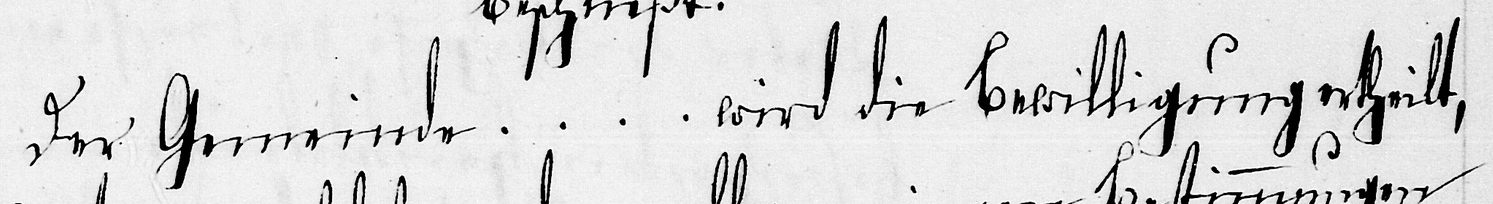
Der Gemeinde … wird die Bewilligung ertheilt
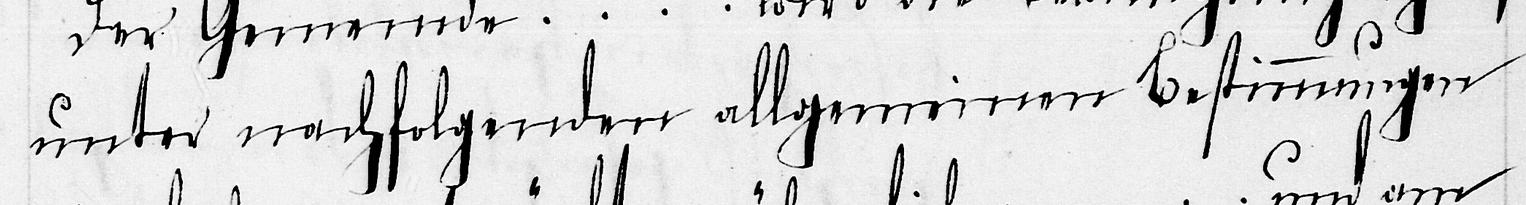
unter nachfolgenden allgemeinen Bestimmungen
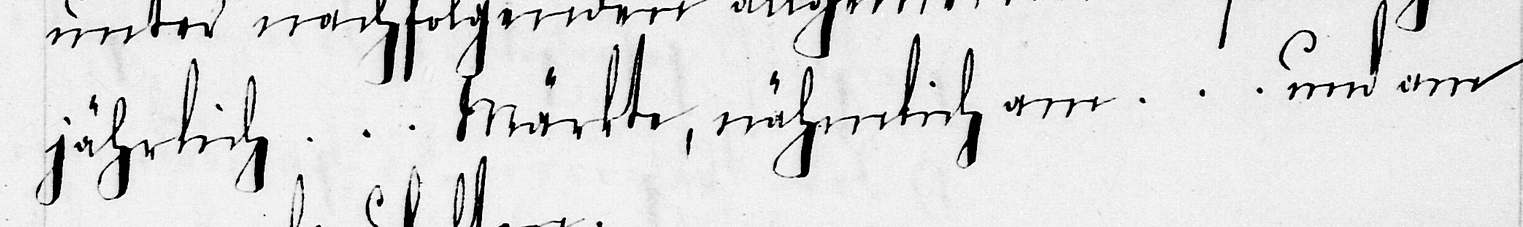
jährlich … Märkte, nähmlich vom … und am
